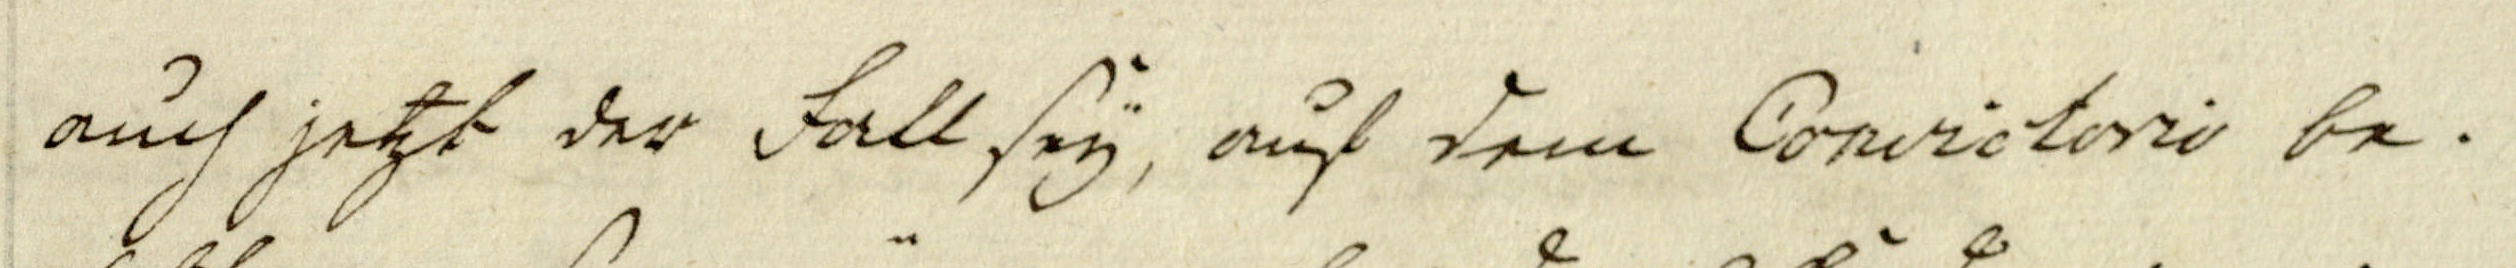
auch jetzt der Fall seÿ, auf dem Convictorio be¬
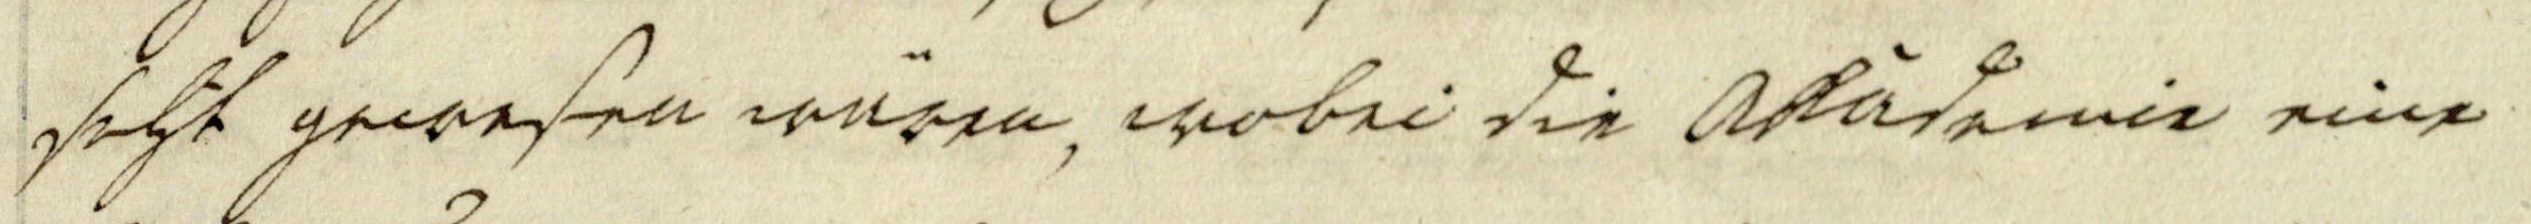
setzt gewesen wären, wobei die Akademie eine
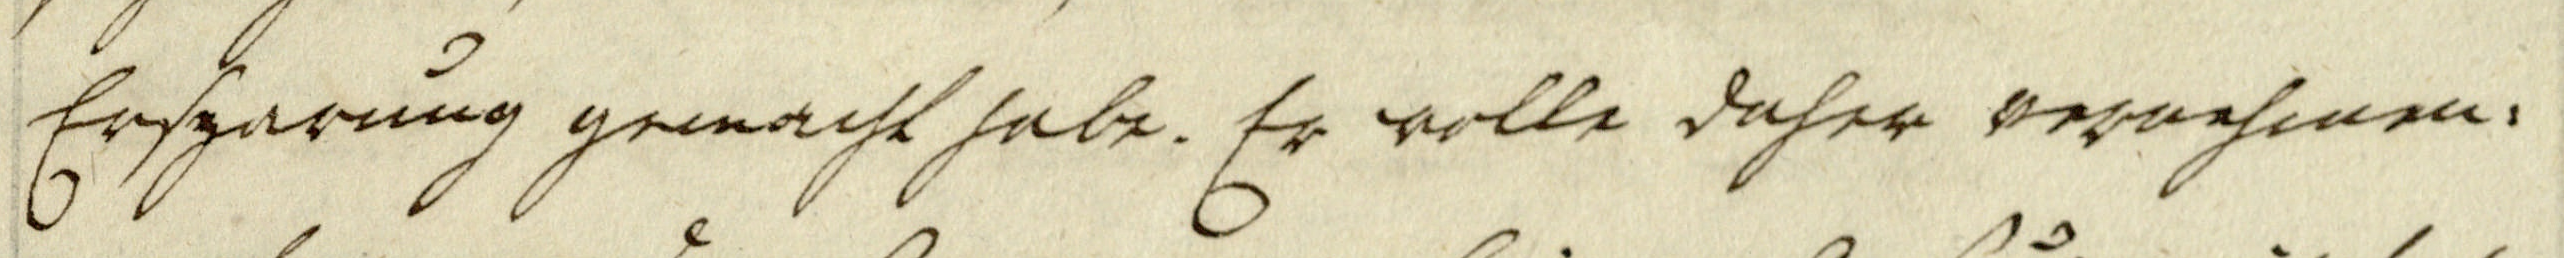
Ersparung gemacht habe. Er wolle daher vernehmen:
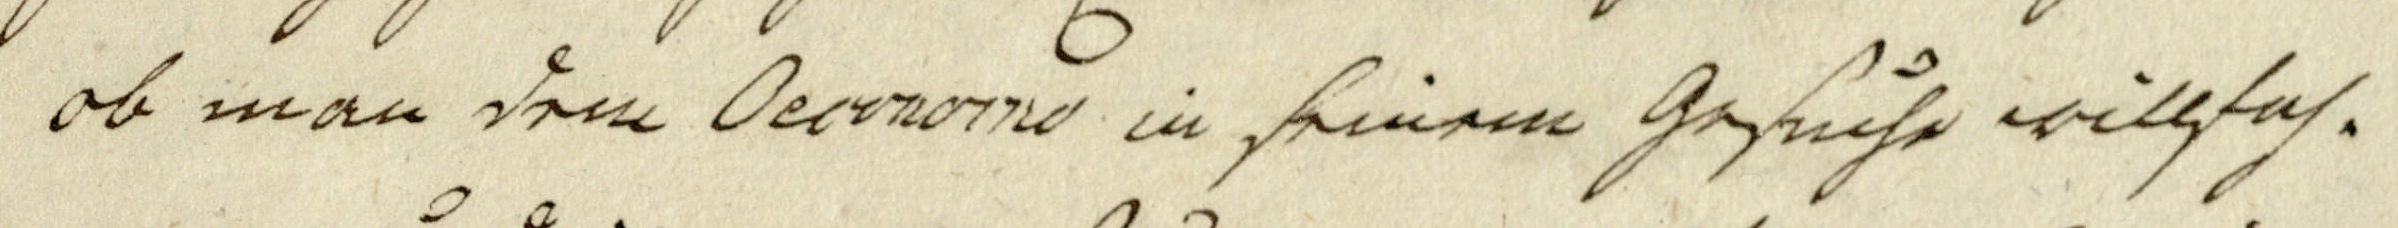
ob man dem Oeconomo in seinem Gesuche willfah¬
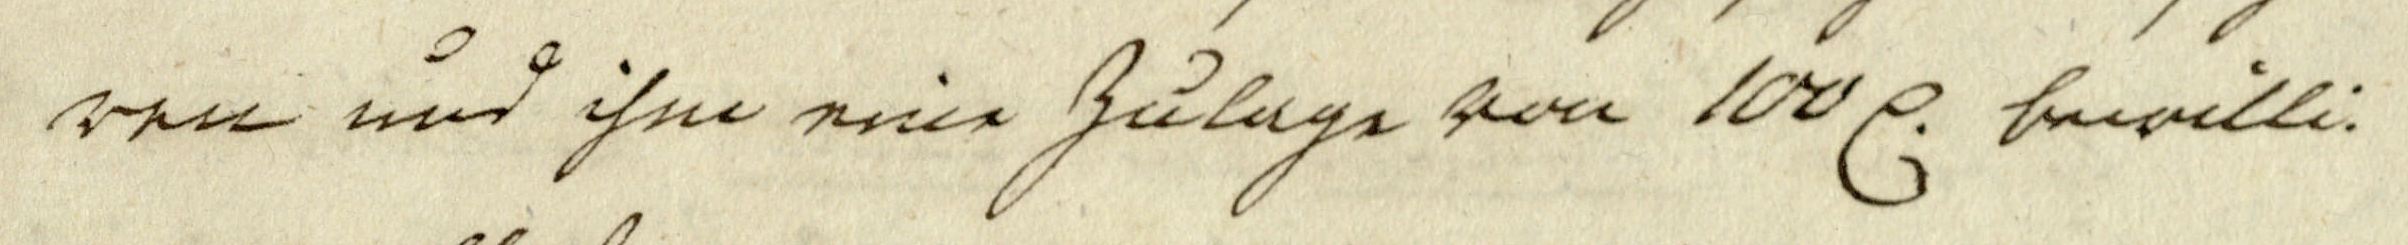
ren und ihm eine Zulage von 100 l. bewilli¬
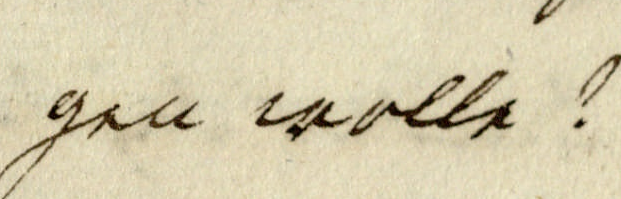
gen wolle?
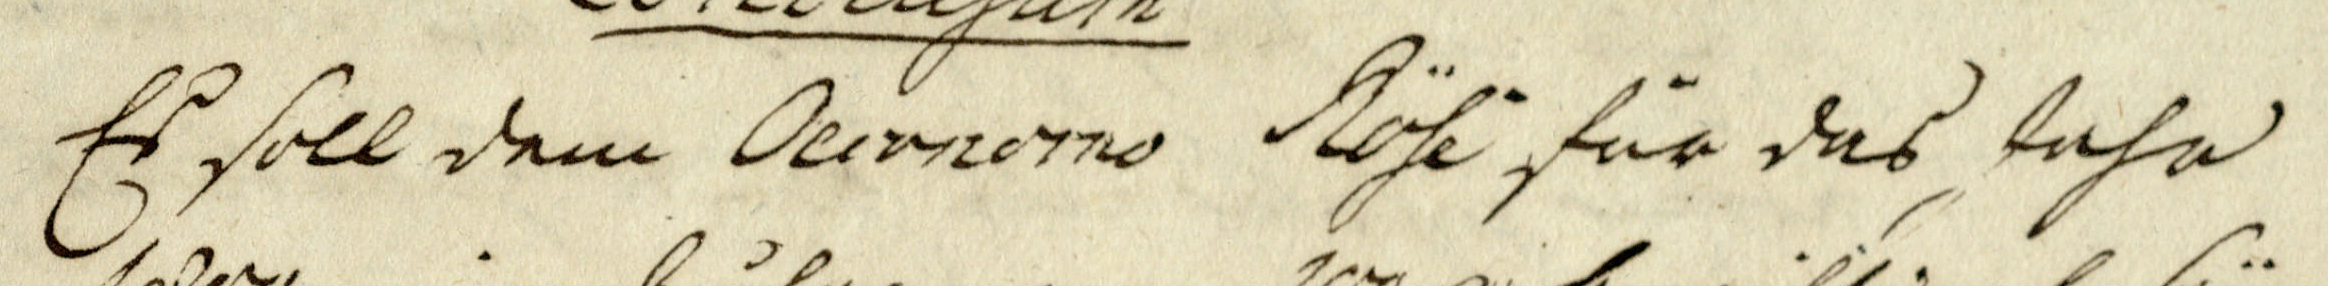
Es soll dem Oeconomo Röse für das Jahr
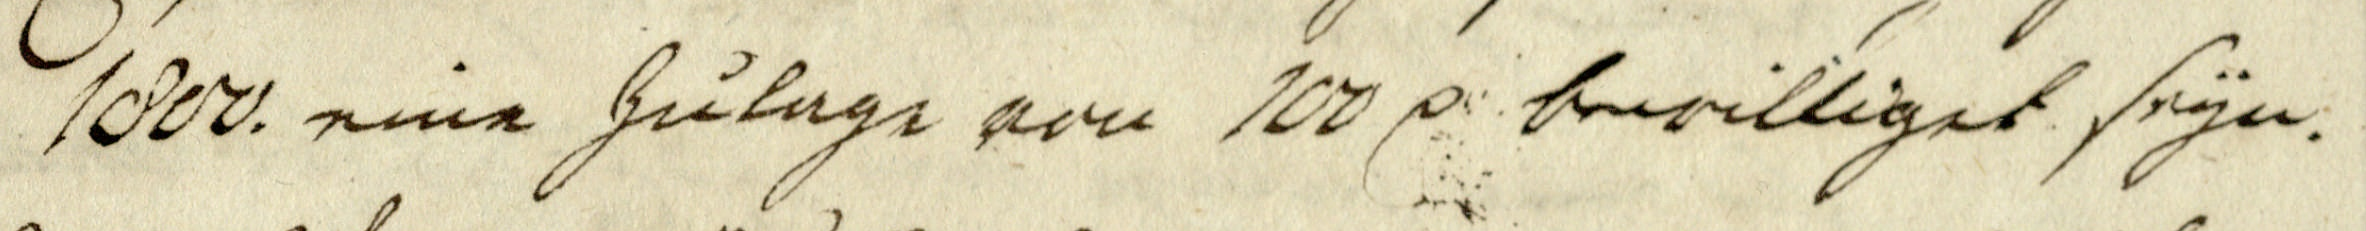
1800. eine Zulage vom 100 l. bewilliget seÿn.
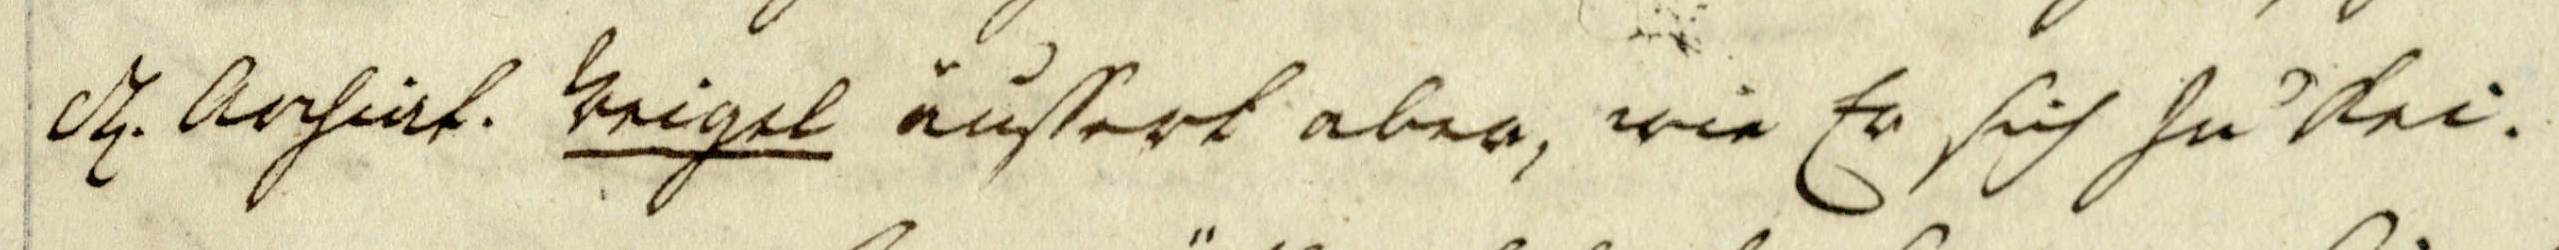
dh. Archiat. Weigel äussert aber, wie Er sich zu kei¬
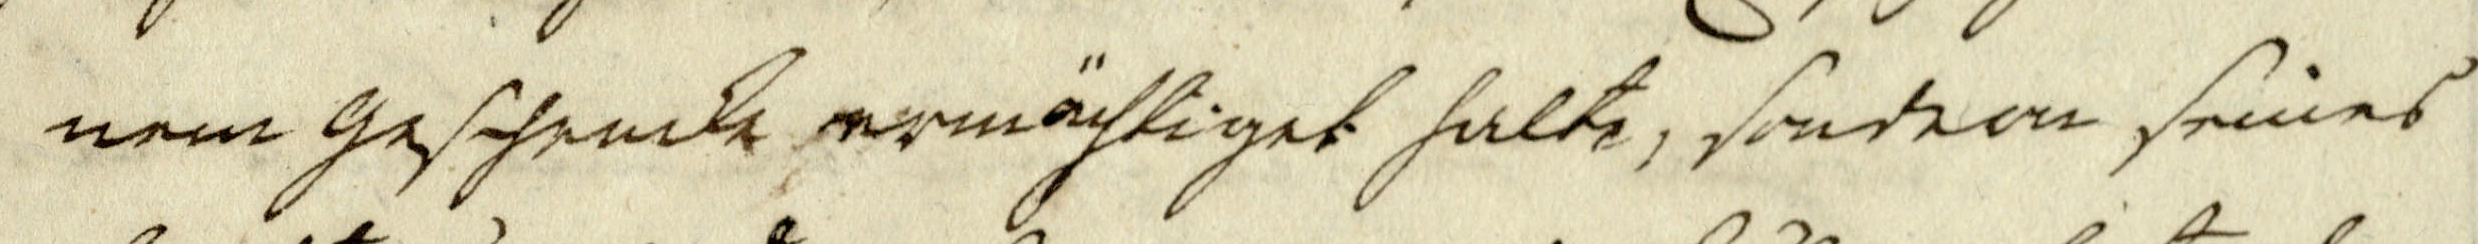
nem Geschencke ermächtiget halte, sondern seines
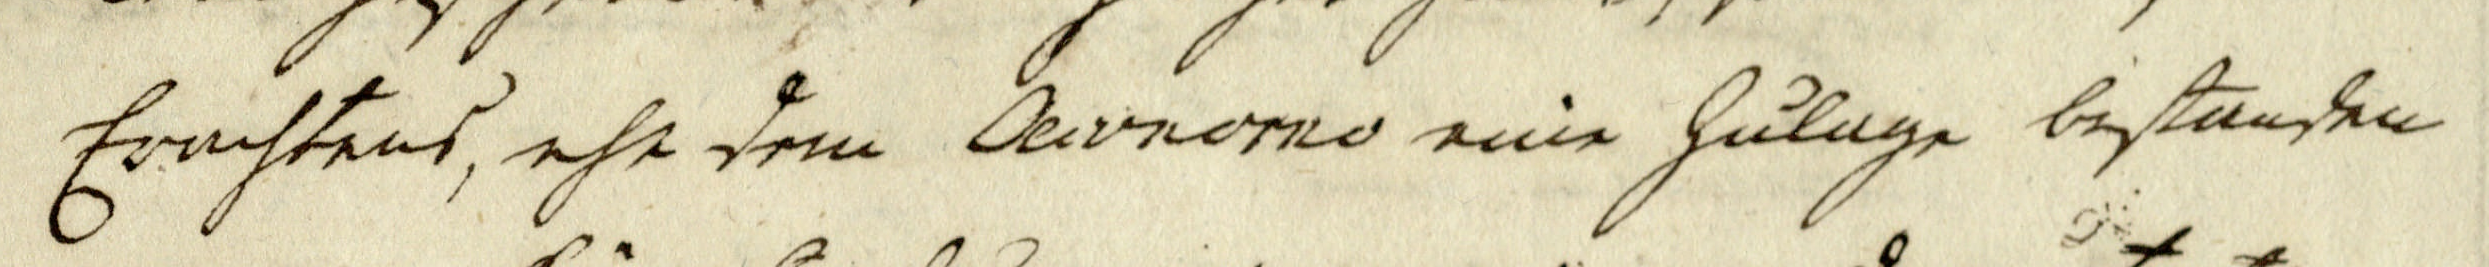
Erachtens, ehe dem Oeconomo eine Zulage bestanden
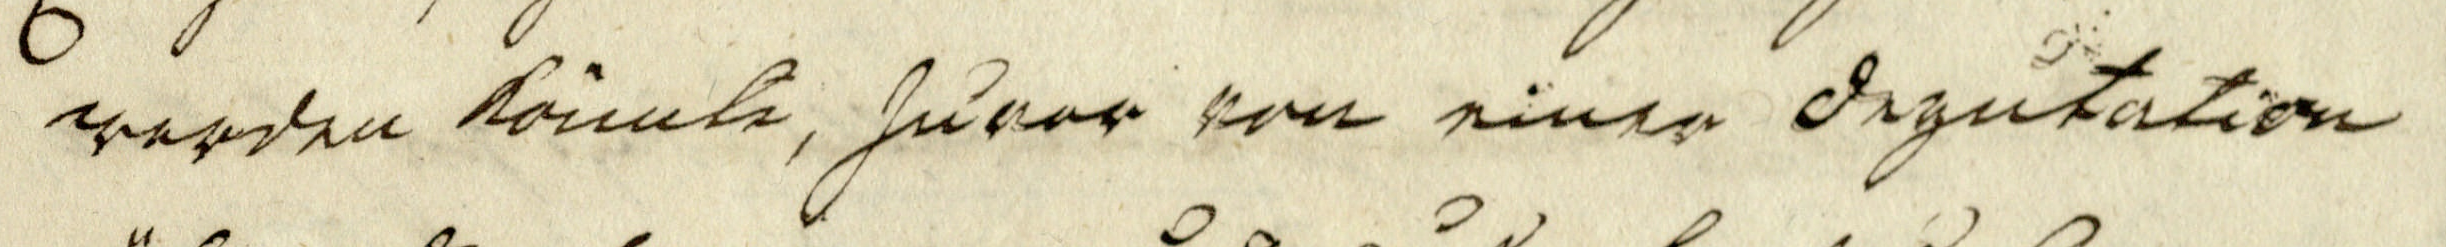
werden könnte, zuvor von einer Deputation
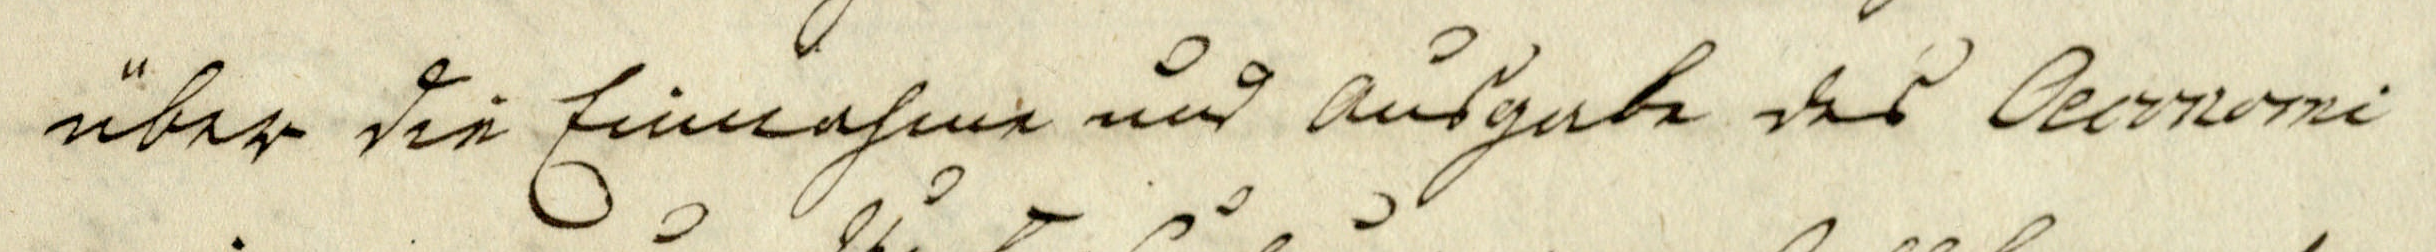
über die Einnahme und Ausgabe des Oeconomi
